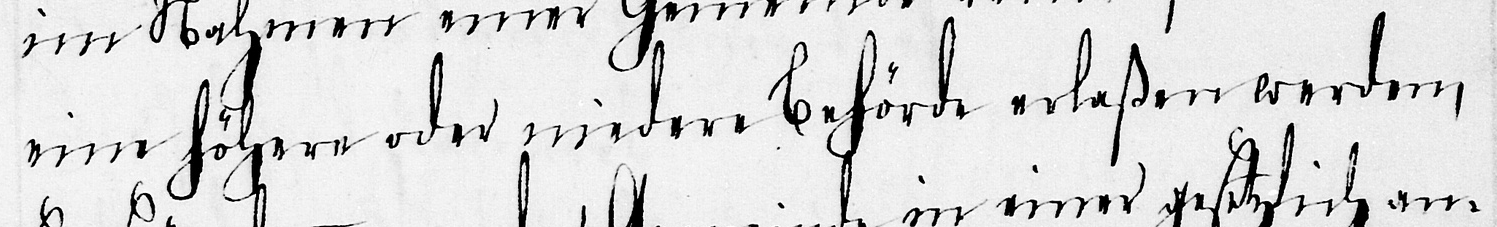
eine höhere oder niedere Behörde erlaßen werden,
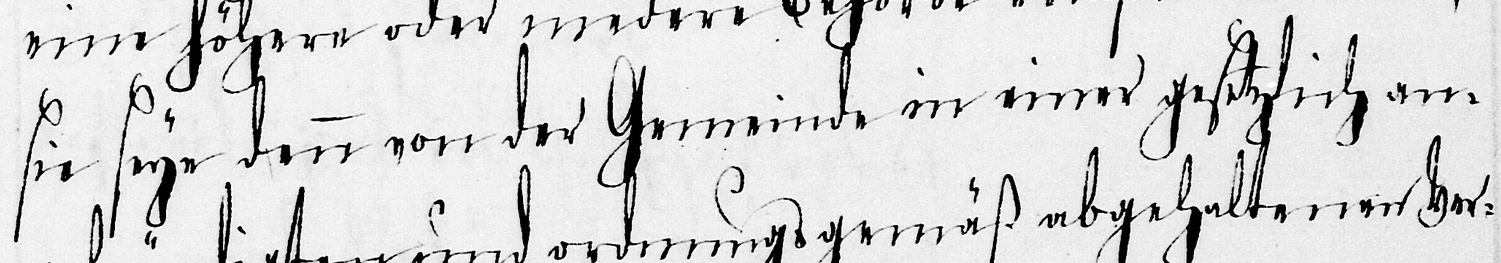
sie seye denn von der Gemeinde in einer gesetzlich an¬
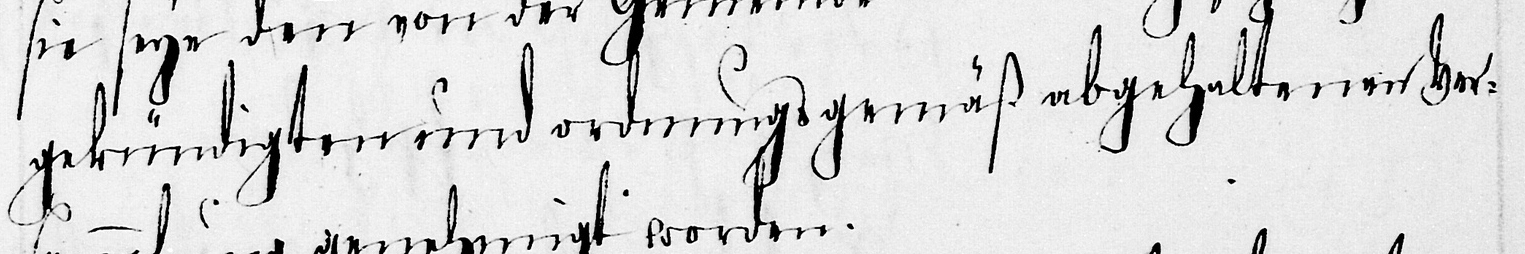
gekündigten und ordnungsgemäß abgehaltenen Ver¬
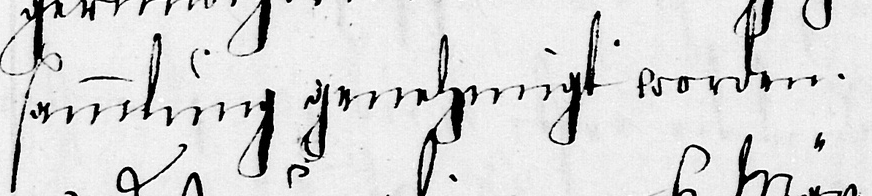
sammlung genehmigt worden.
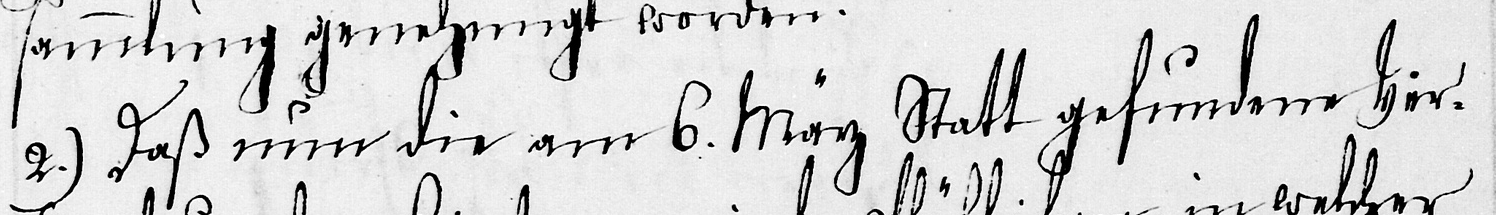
2.) Daß nun die am 6. März Statt gefundene Ver¬
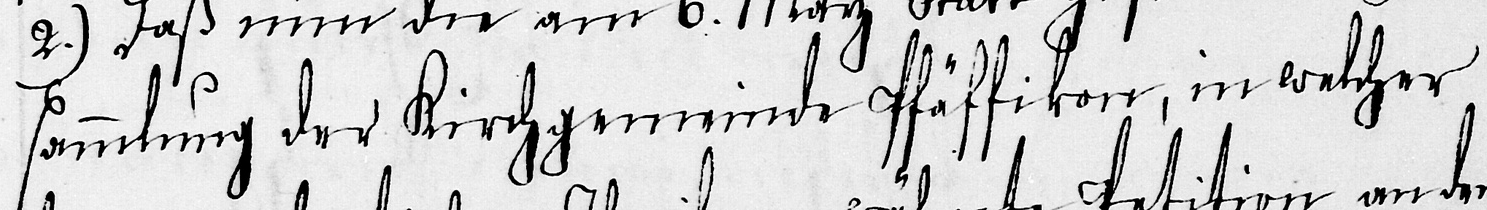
sammlung der Kirchgemeinde Pfäffikon, in welcher
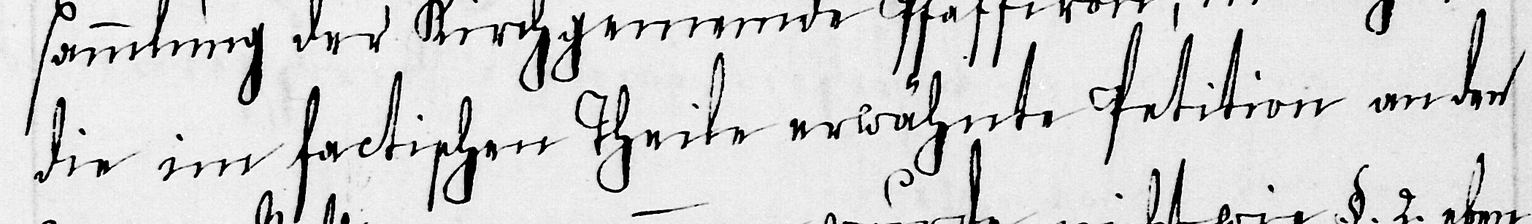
die im factischen Theile erwähnte Petition an den
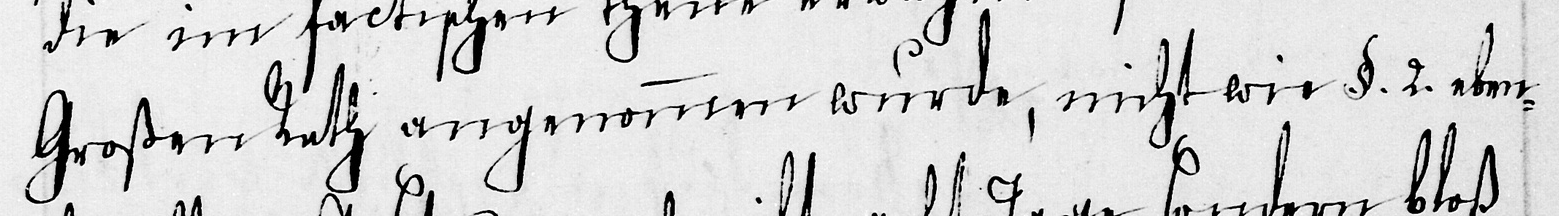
Großen Rath angenommen wurde, nicht wie §. 2. eben¬
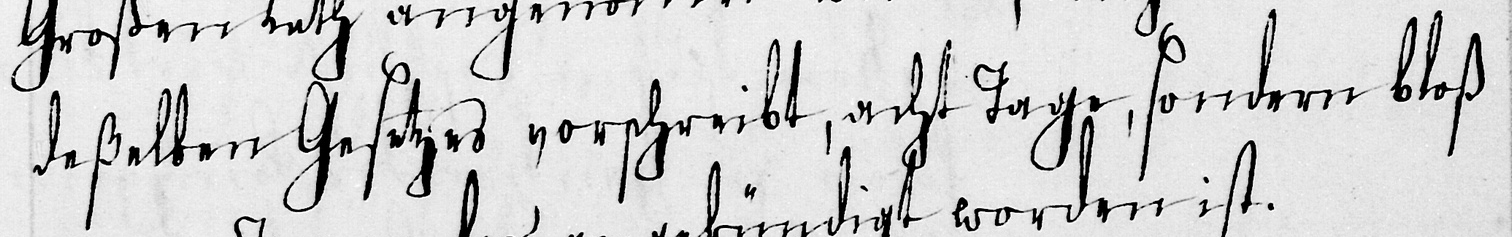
deßelben Gesetzes vorschreibt, acht Tage, sondern bloß
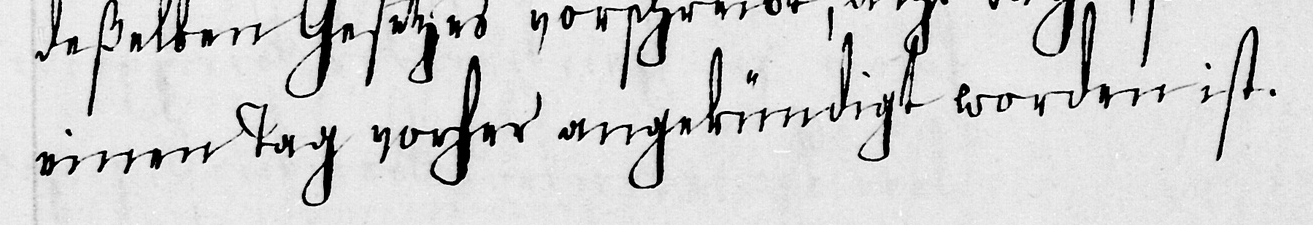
einen Tag vorher angekündigt worden ist.
